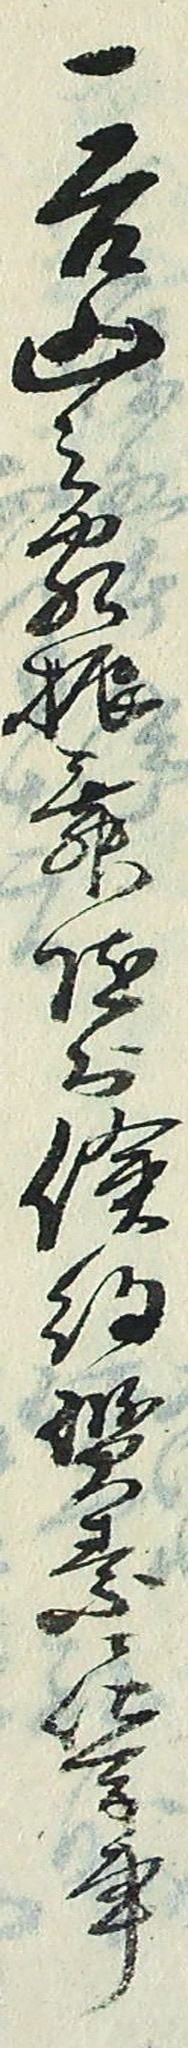一吉凶之客振舞随而倹約質素ニ仕可申事
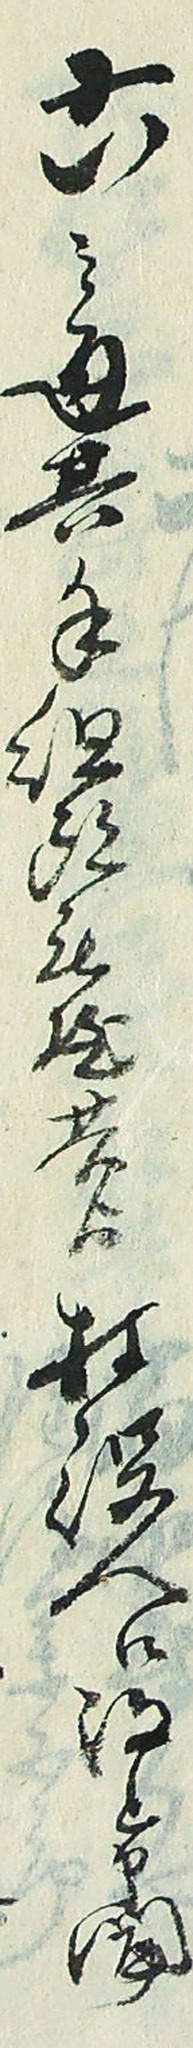右之通其手組頭庄屋共ゟ村役人江得と申聞
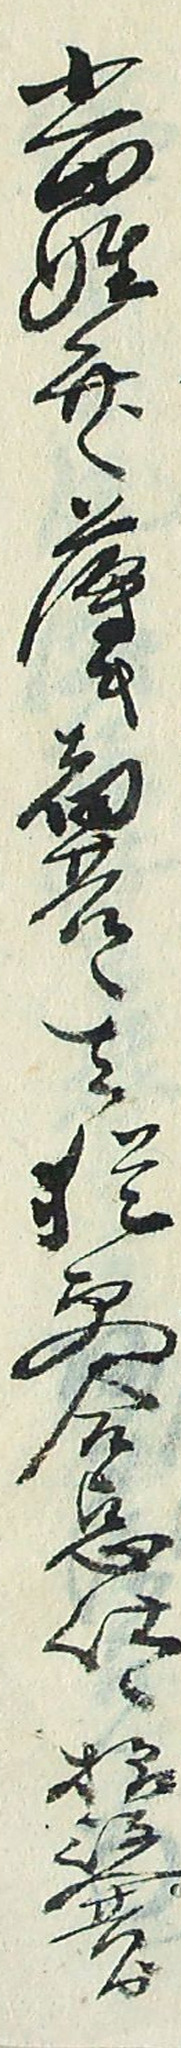小百姓幷薄キ者共へ者猶更合被合点仕候様役人共ゟ

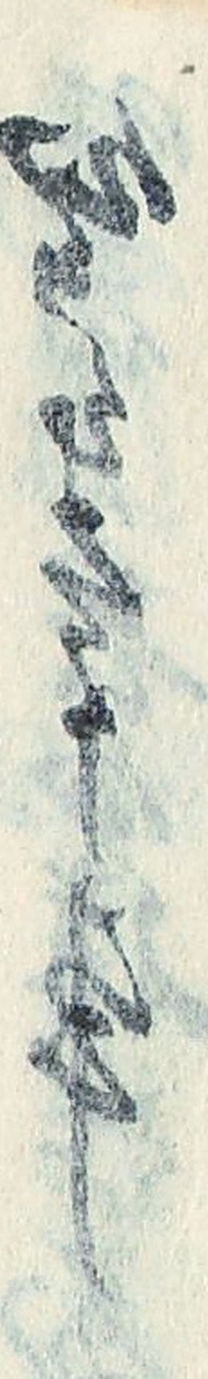正月十一日
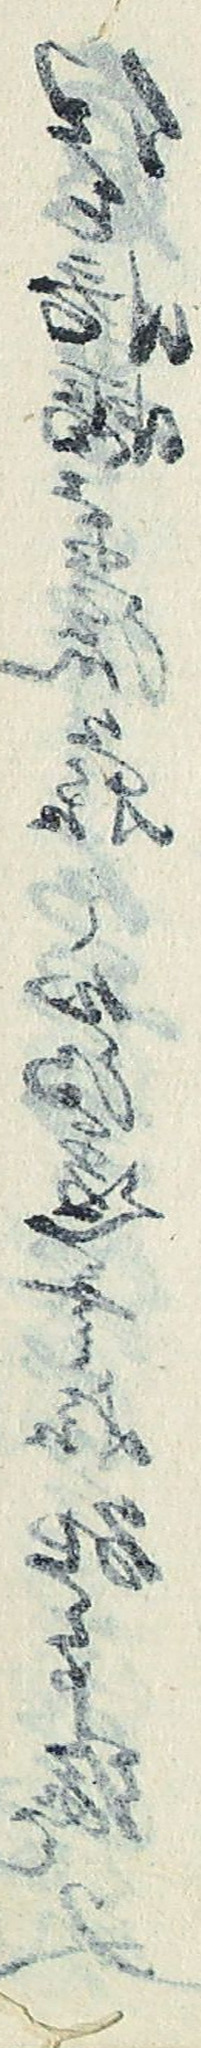正月十一日
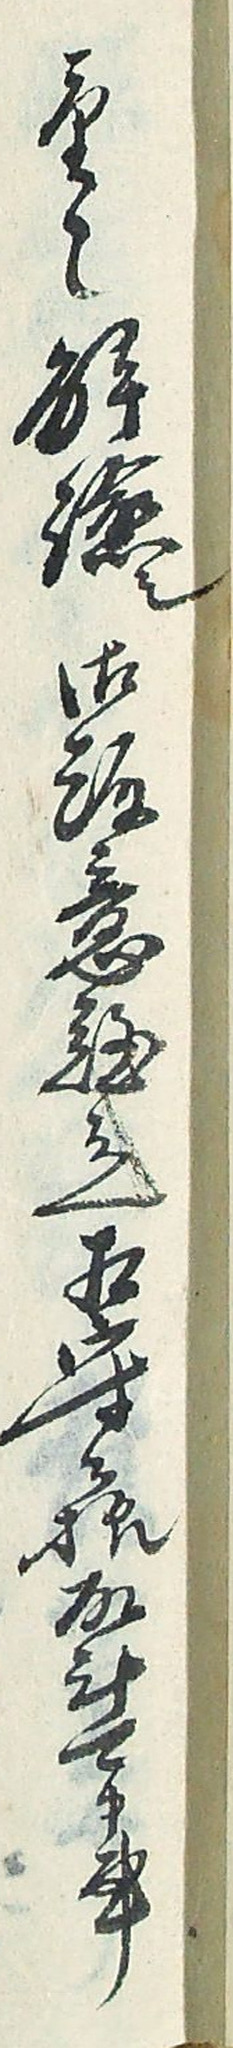重々解諭シ御趣意難有相守候様取計可申事
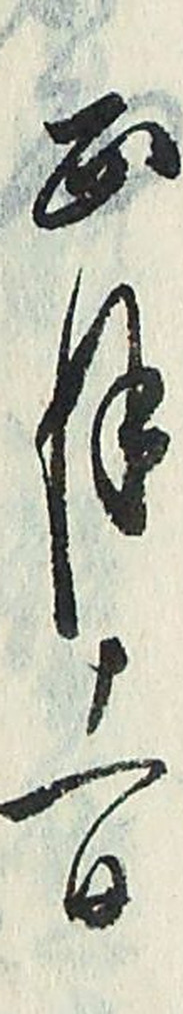正月十一日
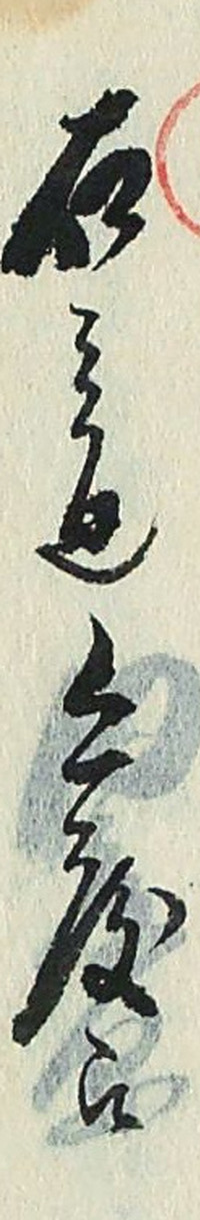右之通今度被
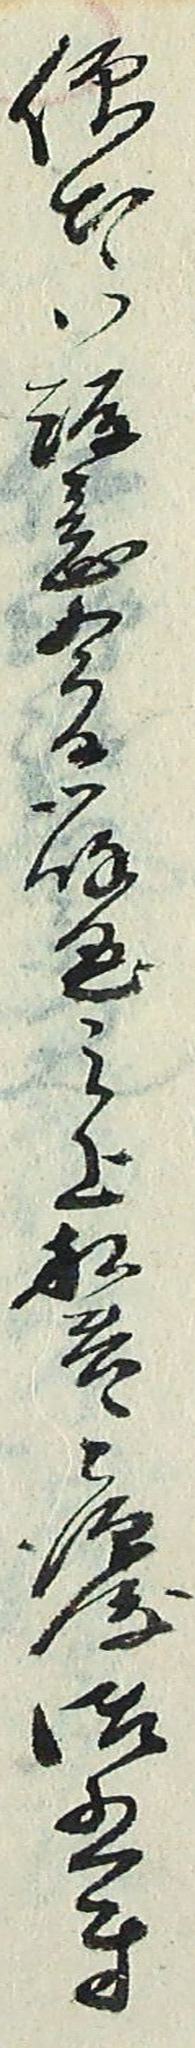仰出候御趣意今日御呼懸之上私共へ被仰渡御書付
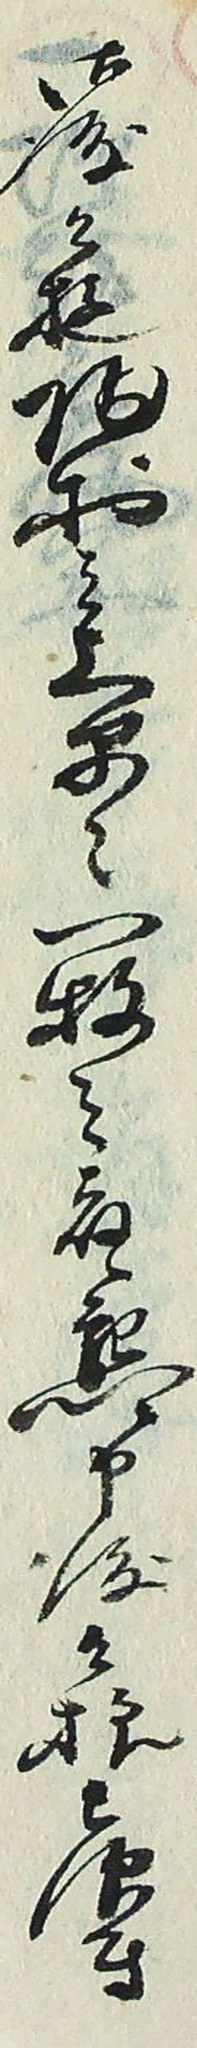御渡被遊帰村之上早々一牧之者へ懇に申渡候様被仰付
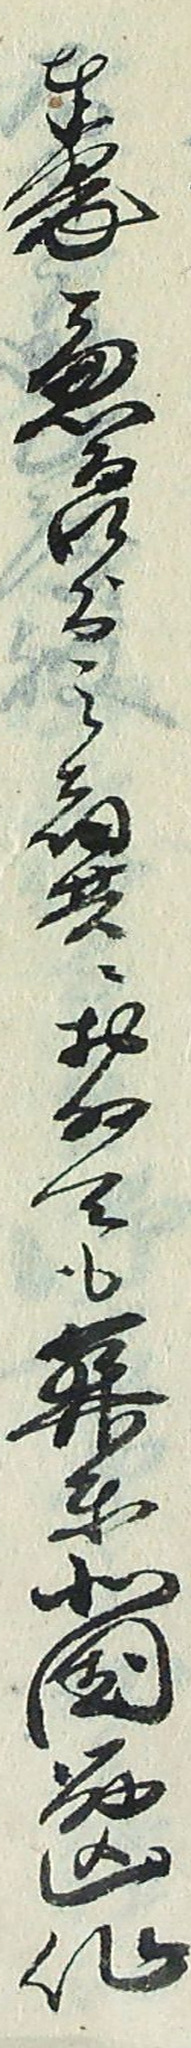奉畏兼而郷分之者共ニおゐても関東北国筋凶作
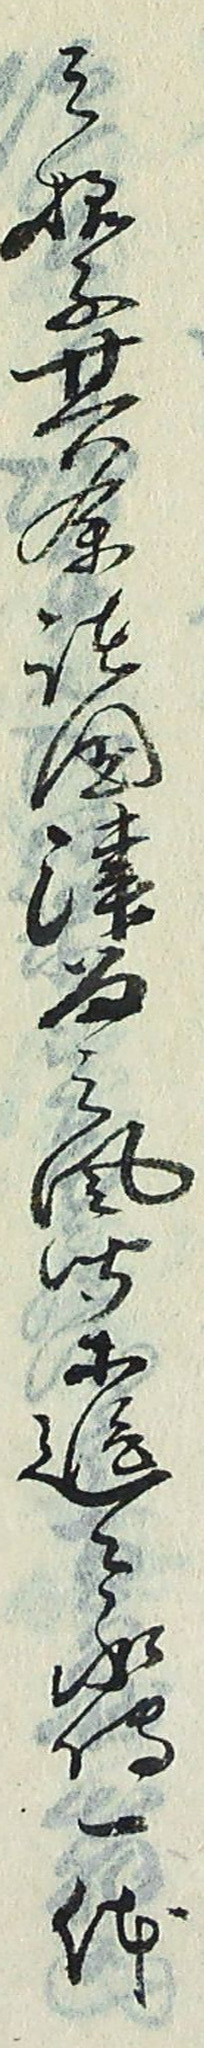之様子其余諸国津留之風聞等追々承傳一体
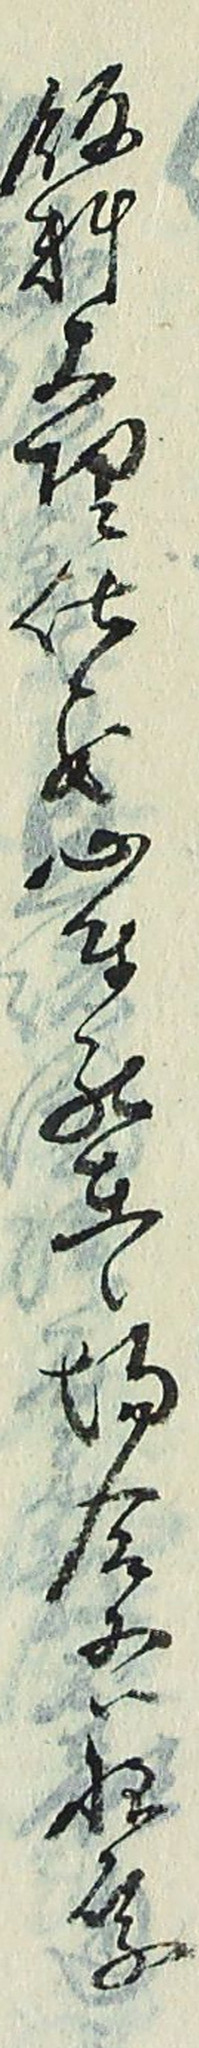飯料大切ニ仕候義心付罷在候場合右様厚
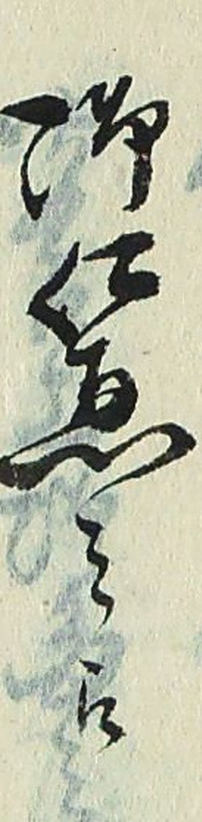御仁恵之被
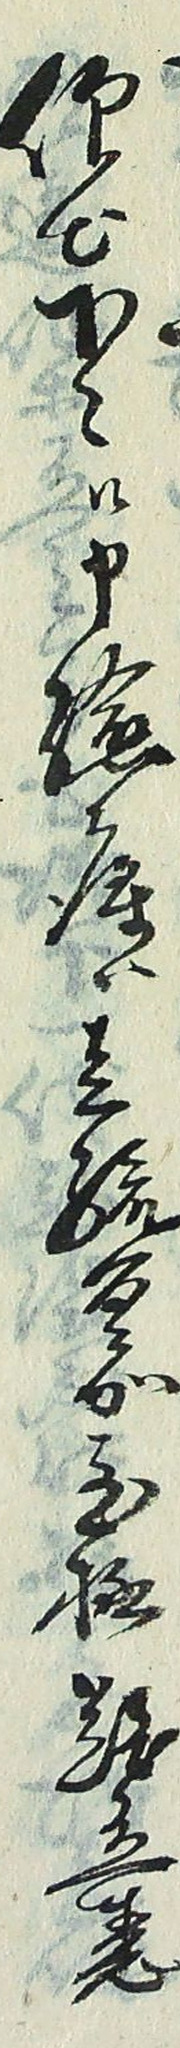仰出下々江申諭候得ハ壱統冥加至極難有奉忝
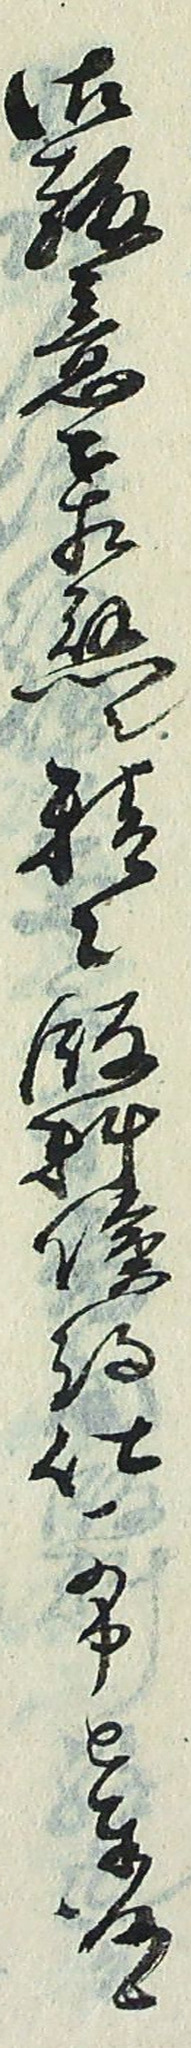御趣意を相応シ精々飯料倹約仕可申と奉存候
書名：諸御趣意書并御下知向之写
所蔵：鳴門教育大学 Naruto University of Education
